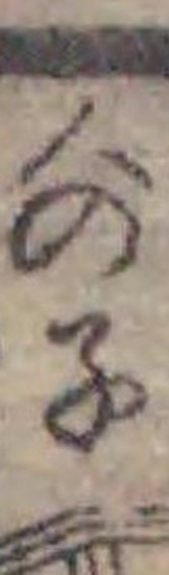人の子
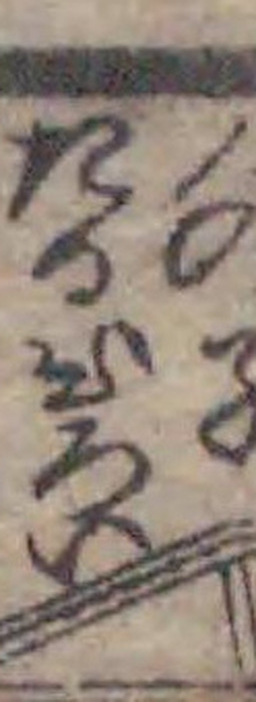たるひろい
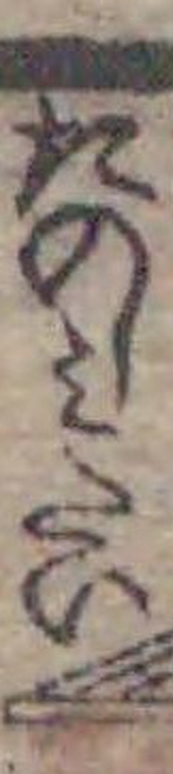たのしみたい
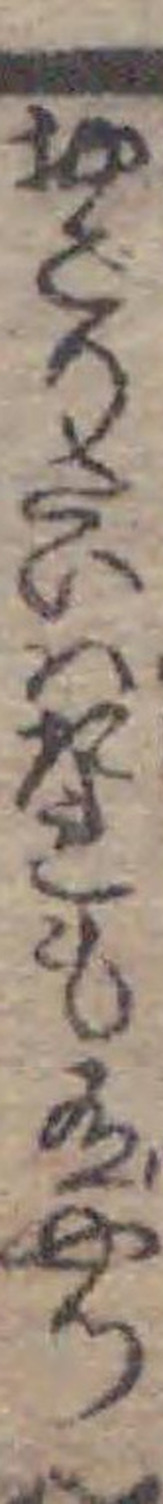おどりたいはたれも有
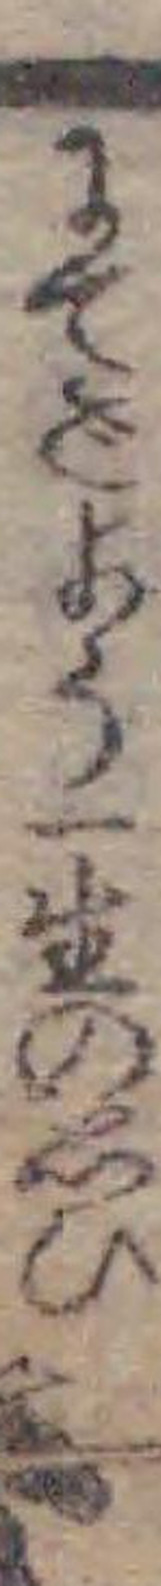にてごよう一生の思ひ
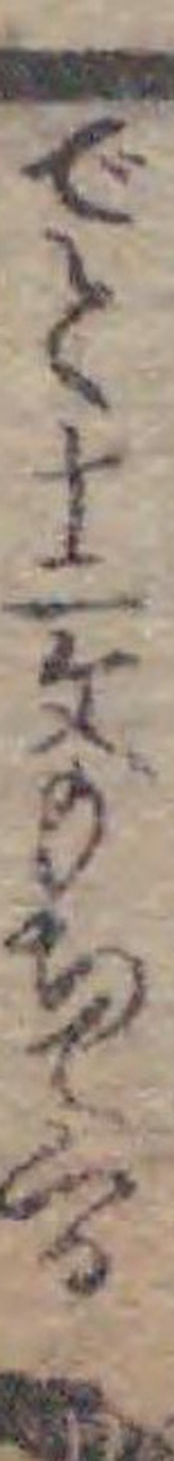でと十二文もちてくる
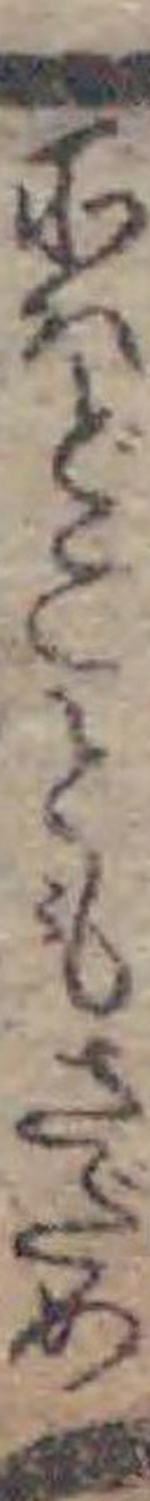所はどこともさだめ
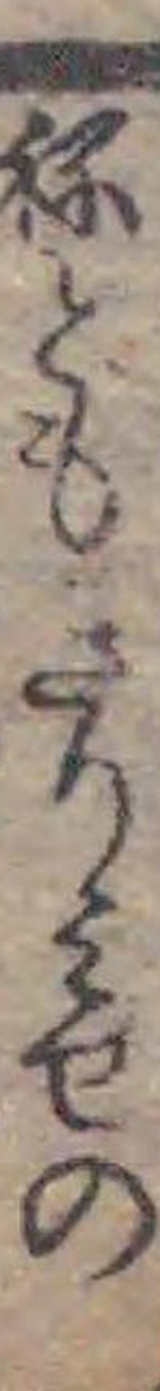ねどもきりみせの
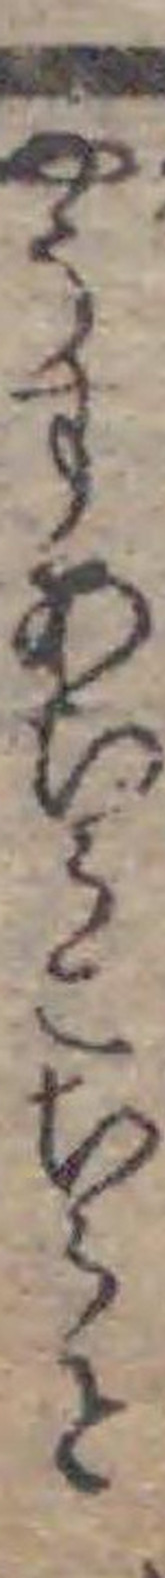やうすあちらこちらと
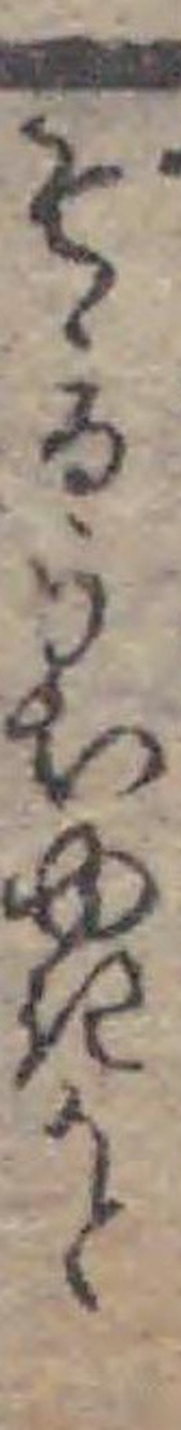そゝるうちゆきかと
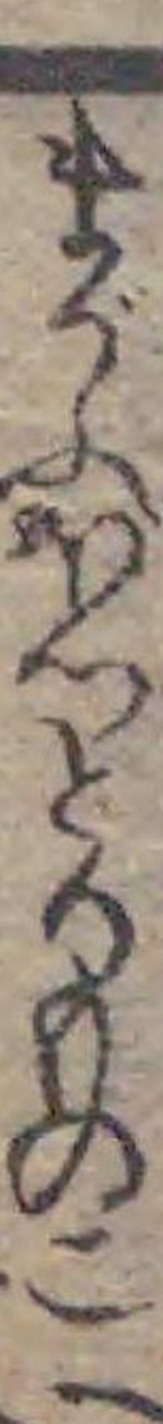まがふほつとりものこ
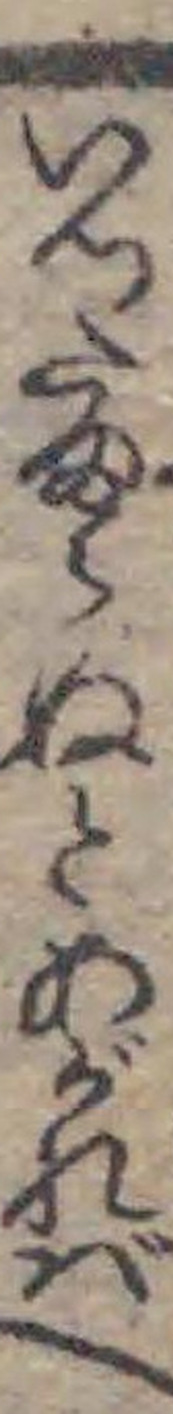いつたまらぬとあがれば
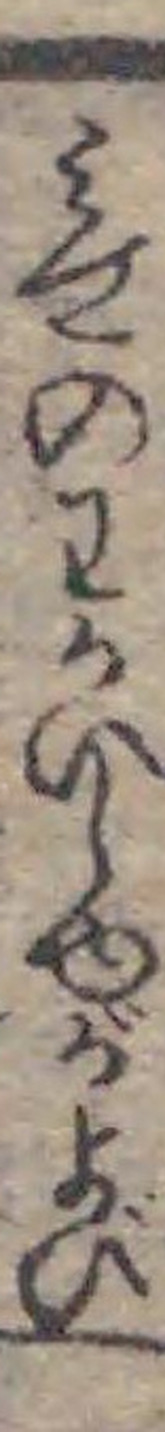みせのわかいしゆがよび
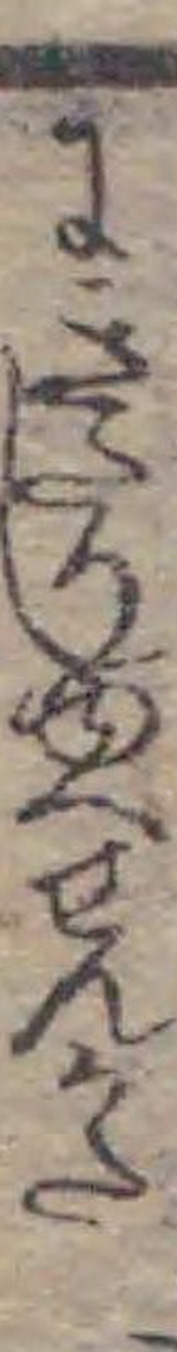にきたりしゆへせんかた
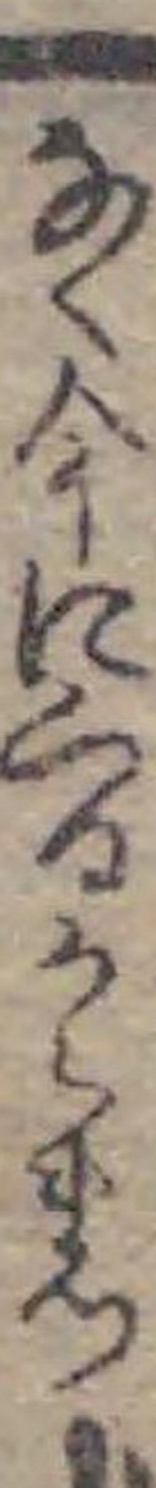なく今にくるからまつ
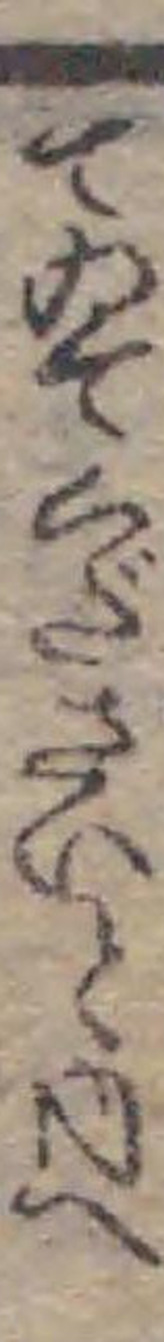てゐてくださいと内へ
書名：紺屋百物語 : 3巻
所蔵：国立国会図書館 National Diet Library, JAPAN
